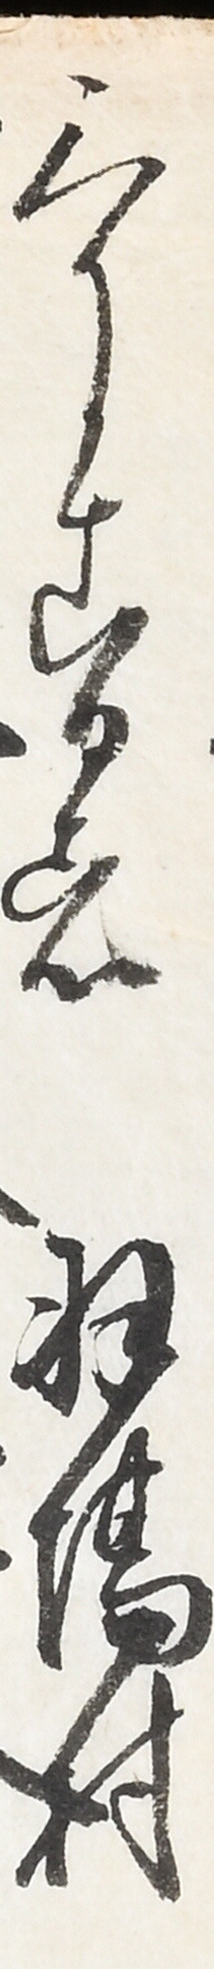三月十八日着羽場村
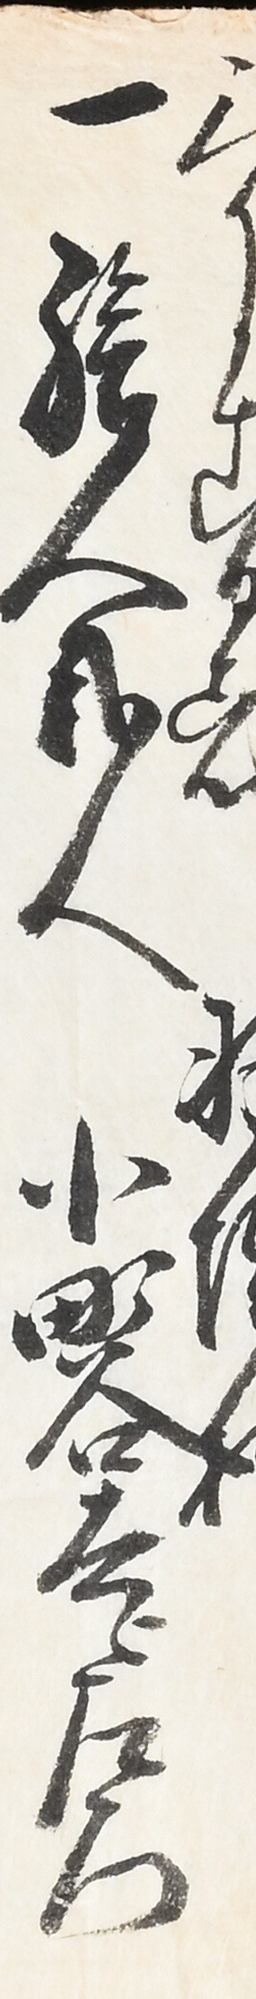一旅人弐人小町谷太郎左衛門
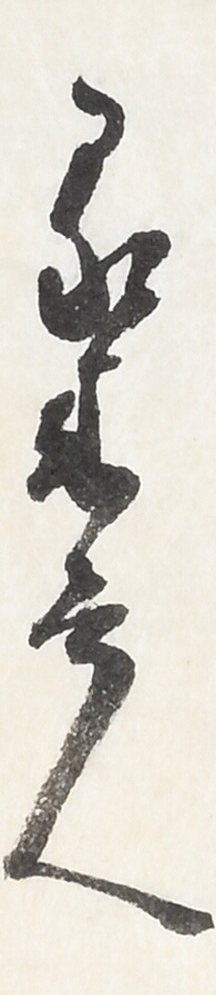家来壱人
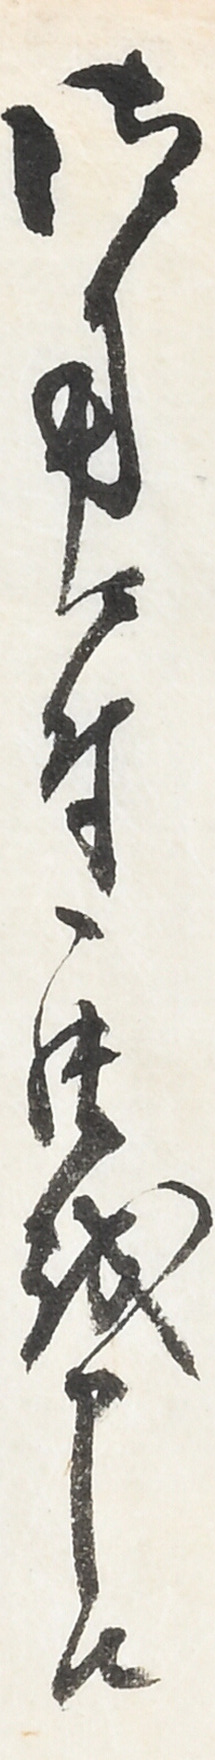御用ニ付罷越申候
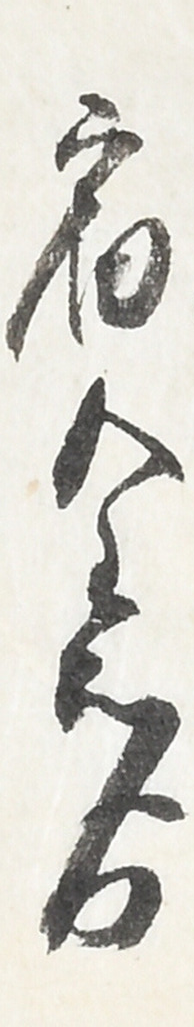宿金右衛門
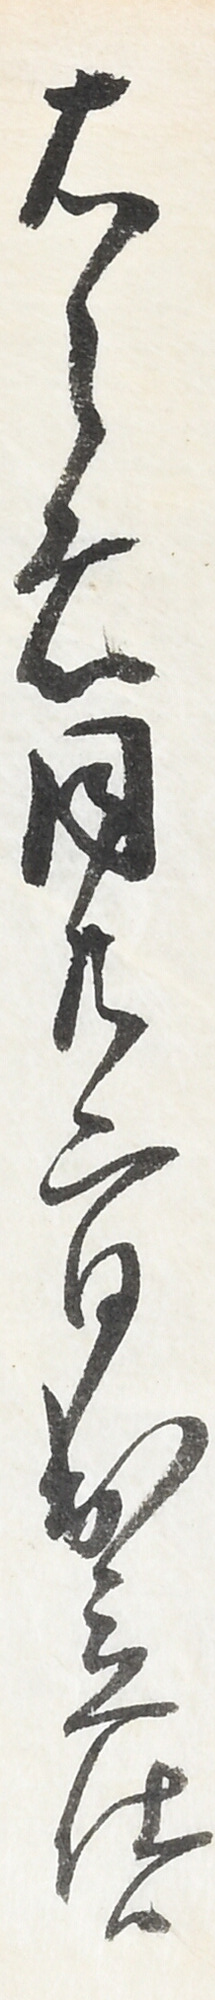右之者同廿二日出立仕候
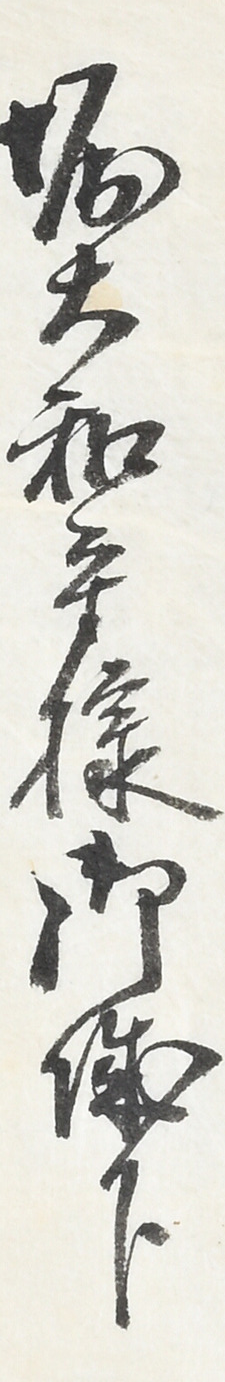堀大和守様御城下
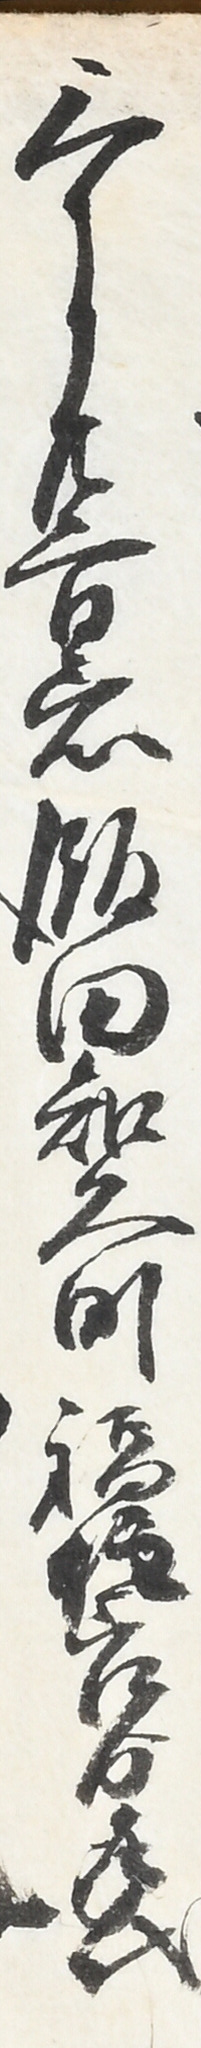三月廿二日着飯田知久町福住善衛門手代

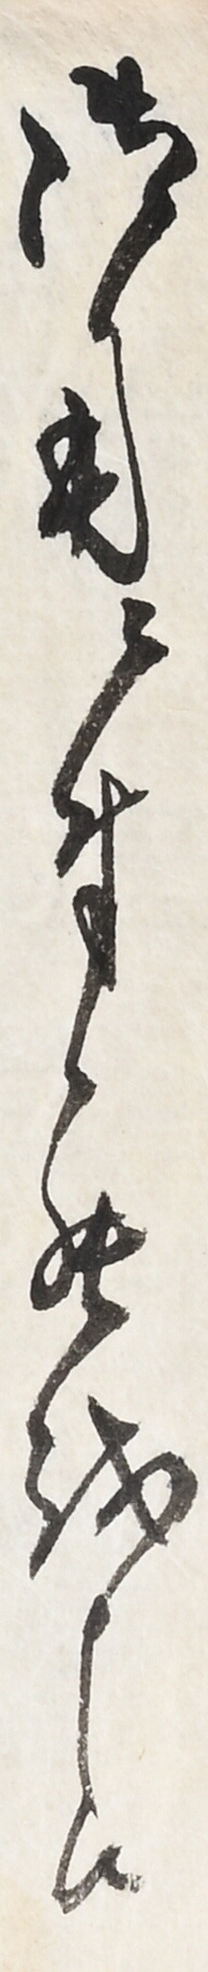御用ニ付罷越申候
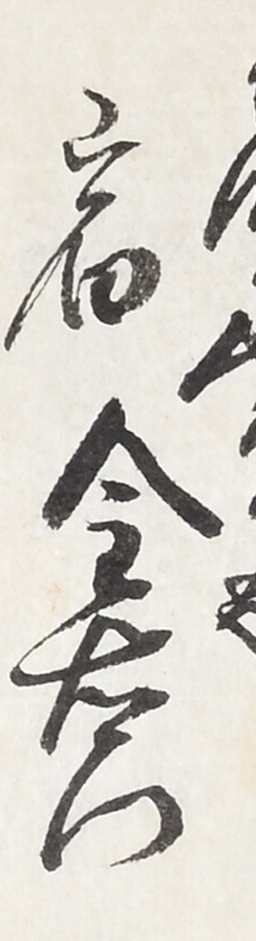宿金右衛門
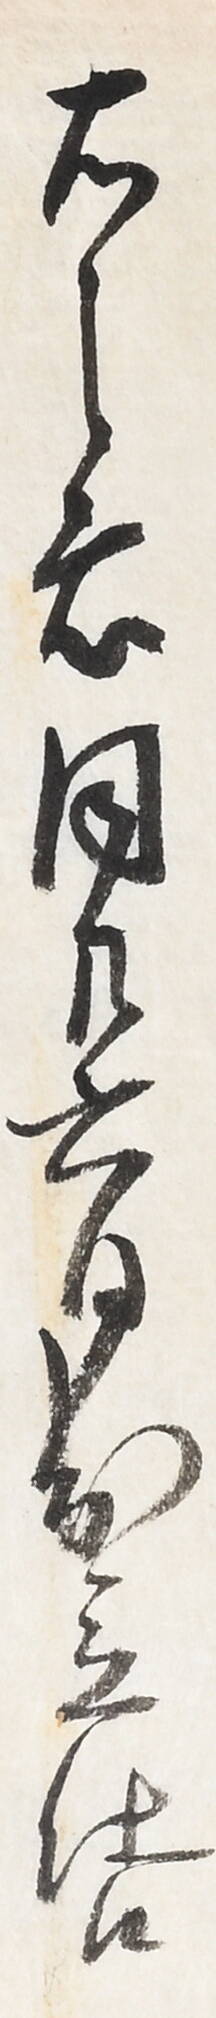右之者同廿六日出立仕候
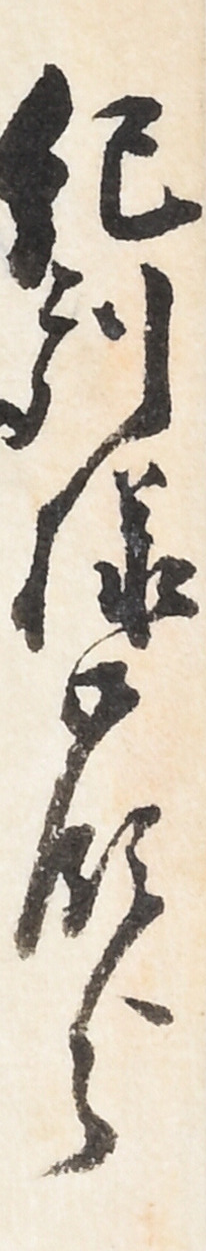紀州様御領分
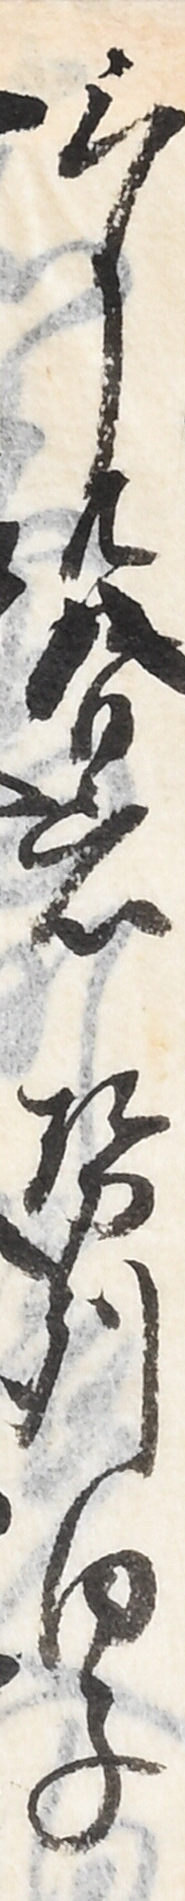三月廿八日着勢州白子
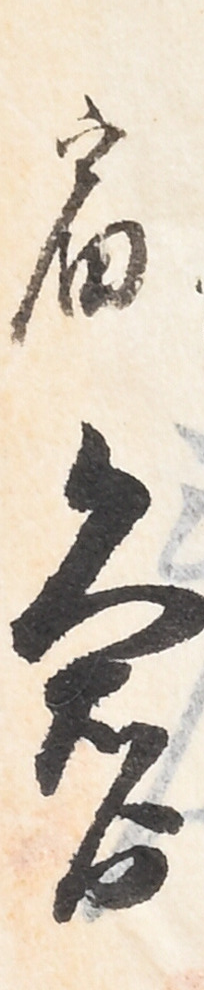宿久右衛門
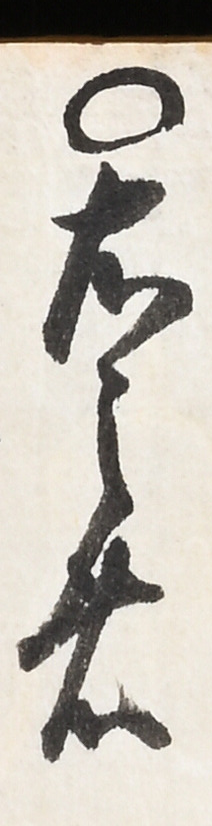〇右之者
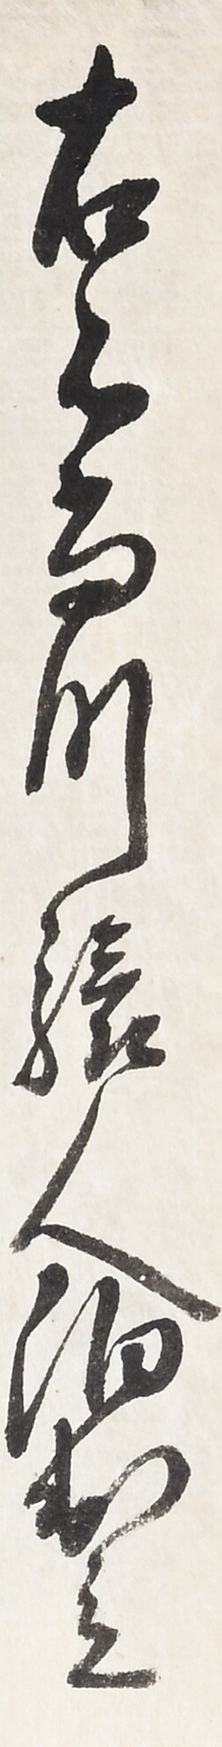右者当町旅人泊出立
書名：旅人泊控帳
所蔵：伊那市立高遠町図書館・合同会社AMANE
